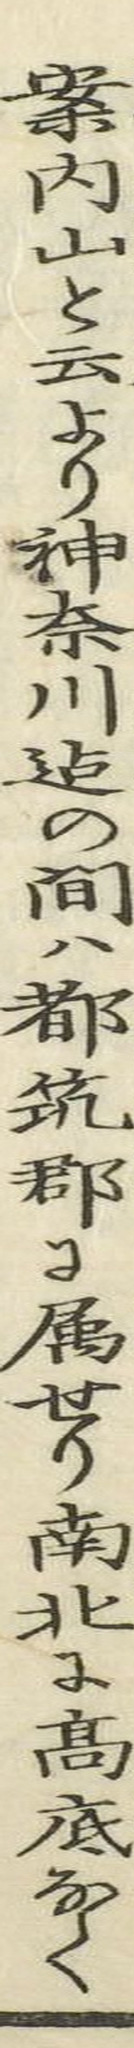案内山と云より神奈川迠の間は都筑郡に属せり南北に高低なく
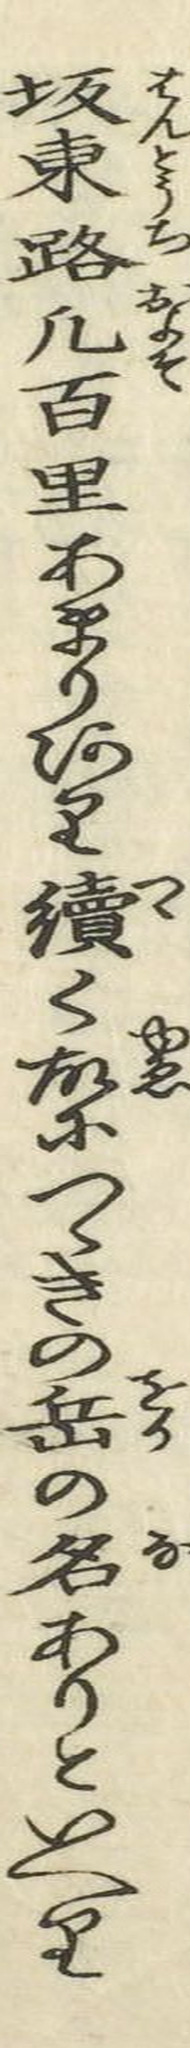坂東路凡百里あまりあり続く故につゝきの岳の名ありといへり
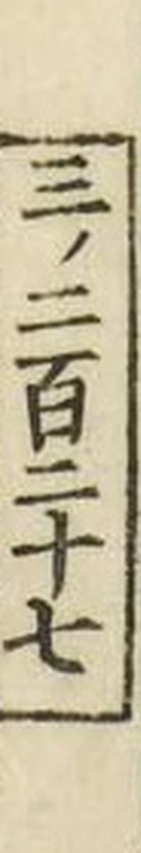三ノ二百二十七
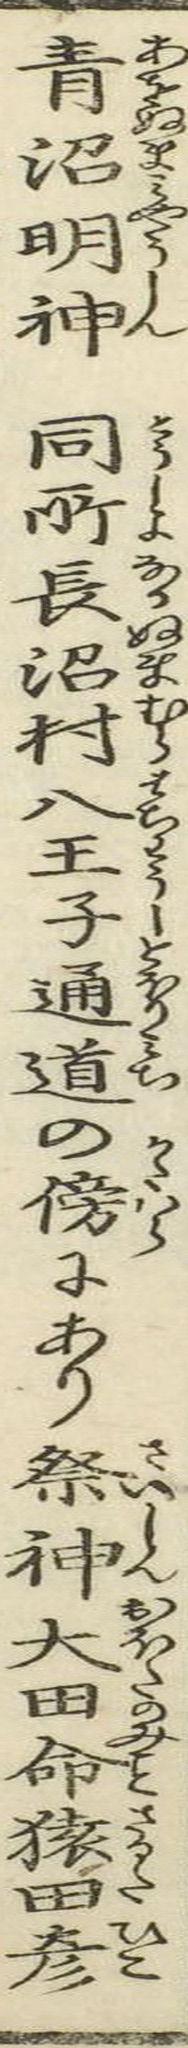青沼明神同所長沼村八王子通道の傍にあり祭神大田命猿田彦
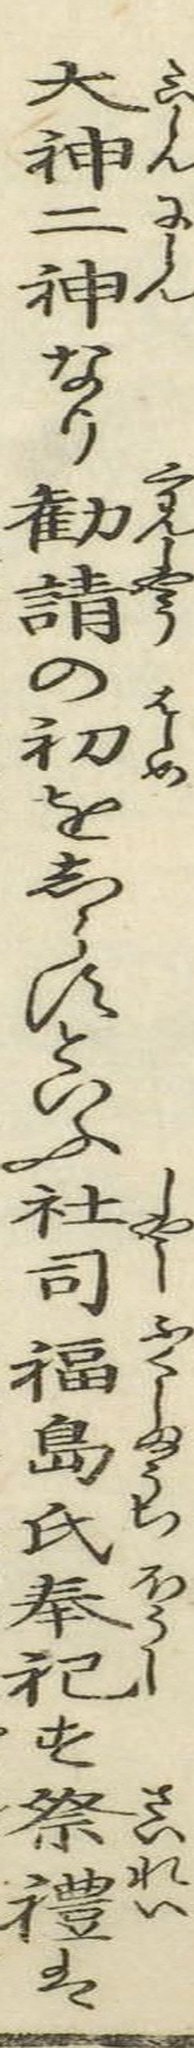大神二神なり勧請の初をしらすといふ社司福島氏奉祀す祭礼は
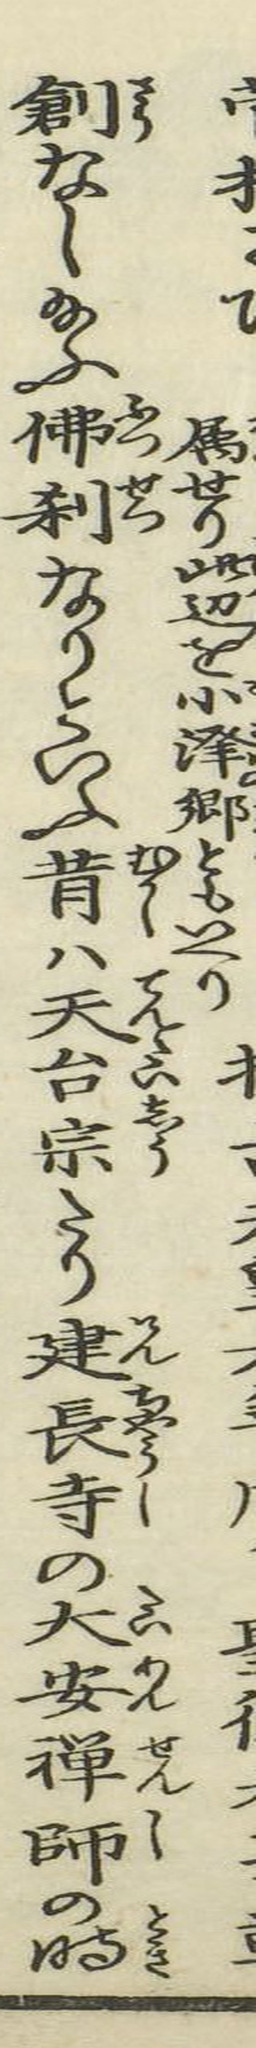創なし給ふ佛刹なりといふ昔は天台宗たり建長寺の大安禅師の時
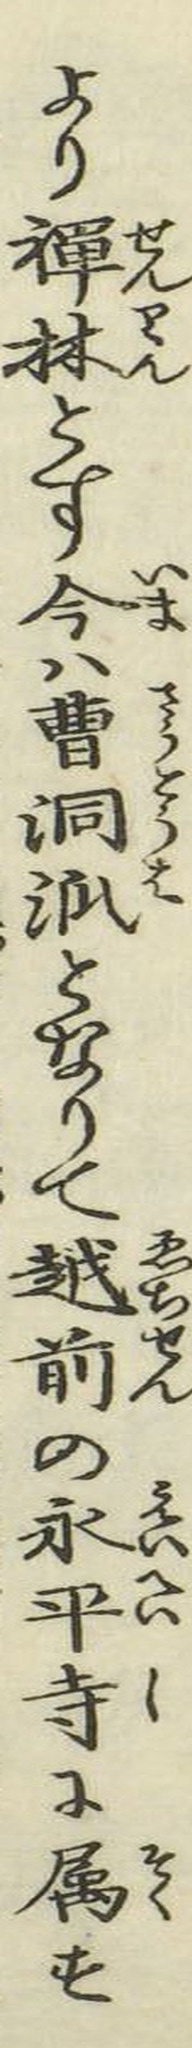より禅林とす今は曹洞派となりて越前の永平寺に属す

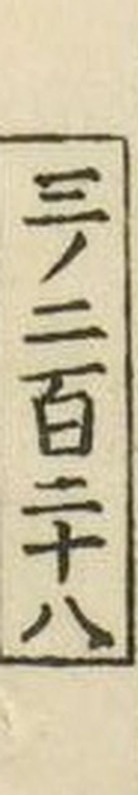三ノ二百二十八
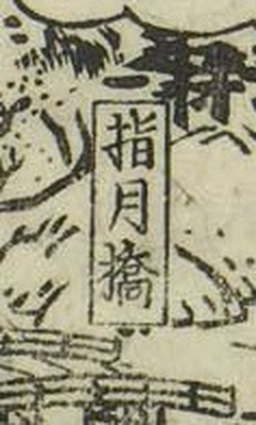指月橋
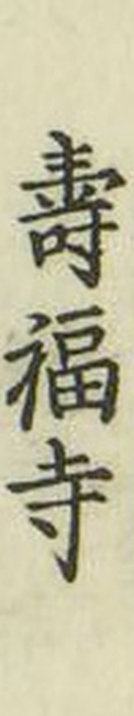寿福寺

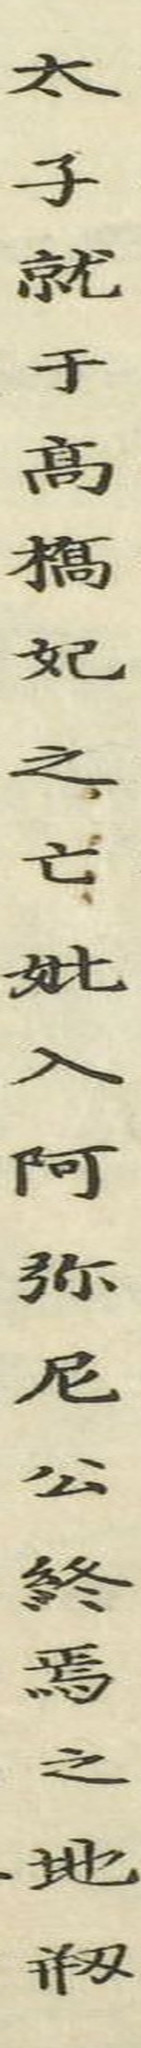太子就于高橋妃之亡妣入阿弥尼公終焉之地剏
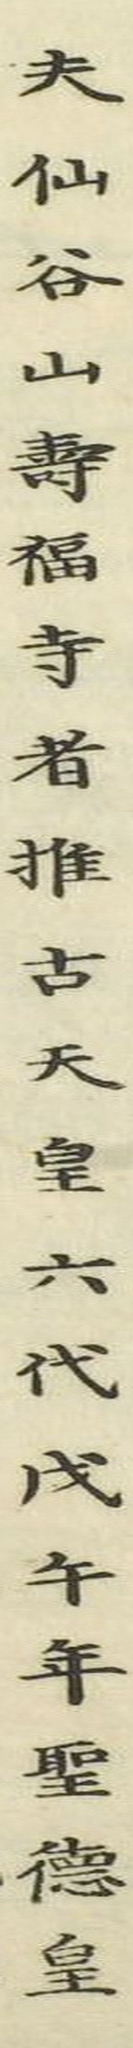夫仙谷山寿福寺者推古天皇六代戊午年聖徳皇
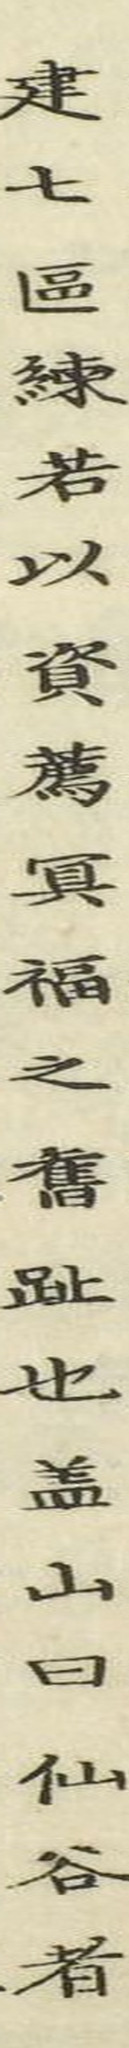建七区練若以資薦冥福之奮趾也盖山曰仙谷者
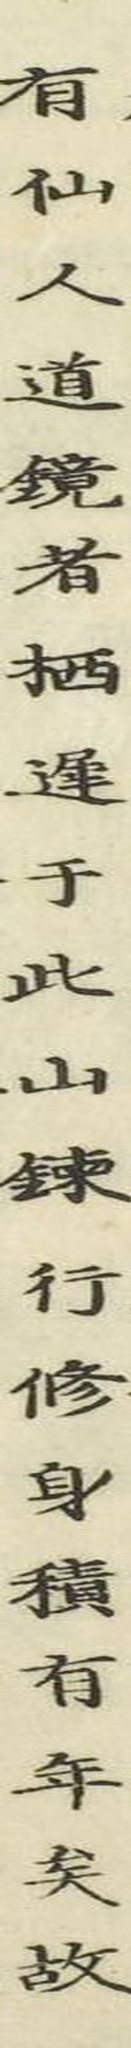有仙人道鏡者栖遅于此山錬行修身積有年矣故
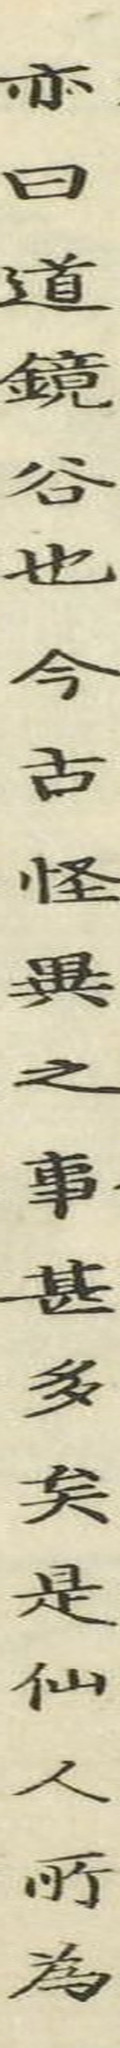亦曰道鏡谷也今古怪異之事甚多矣是仙人所為
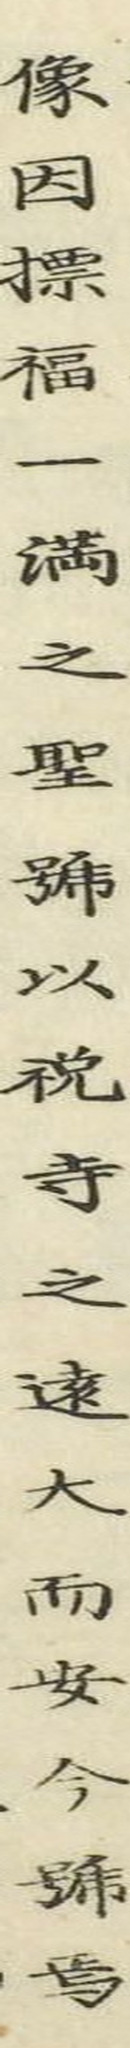像因摽福一満之聖號以祱寺之遠大而安今號焉
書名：江戸名所図会 20巻 巻之10
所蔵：東京学芸大学教育コンテンツアーカイブ
